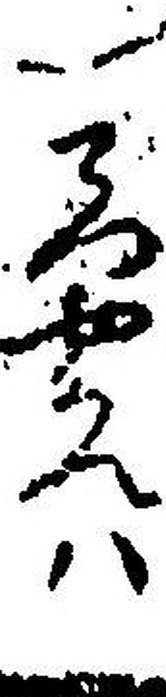てつやかんは
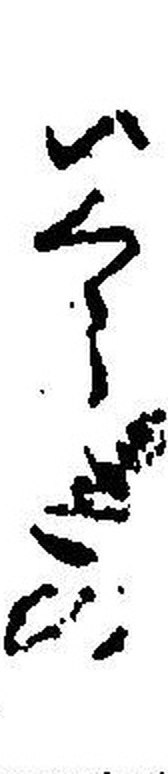いくらだの
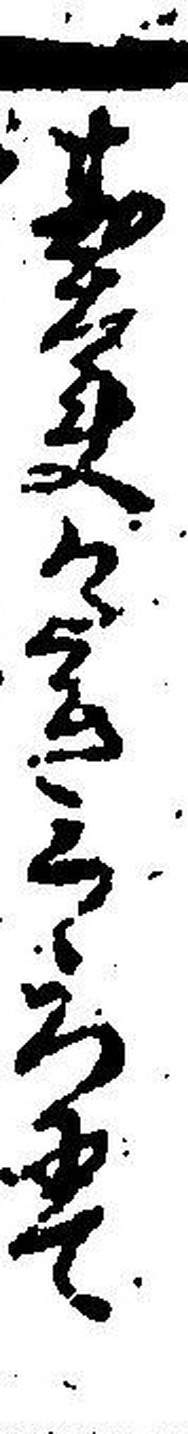甚太夫かたきこゝろにて
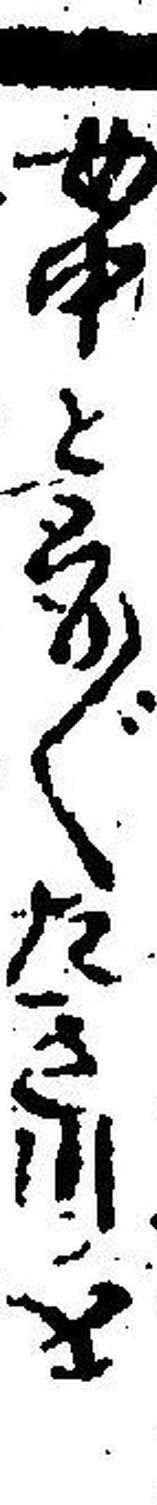女中とも〴〵たき川を
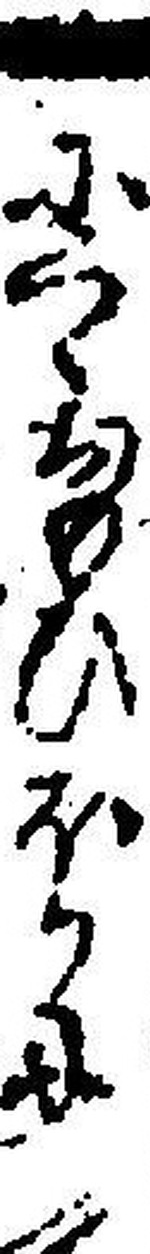にくゝおもひほかに
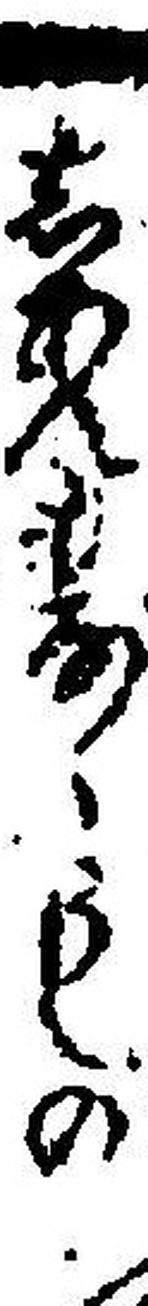しあんもなくうしの
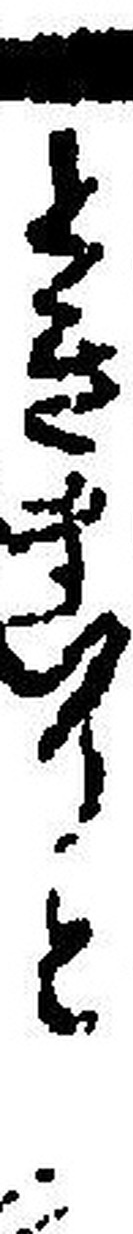ときまいりと
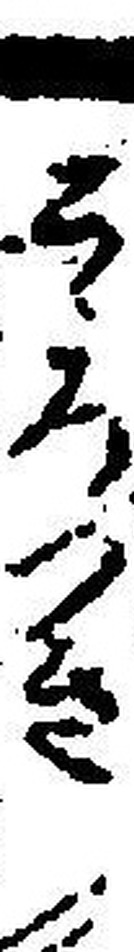こゝろつき
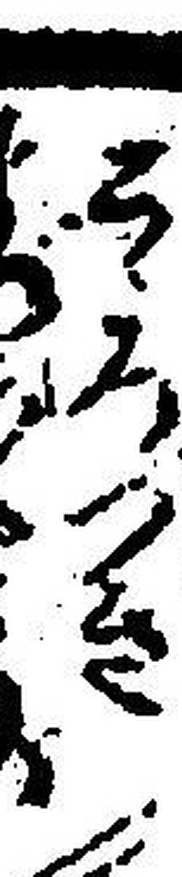こゝろつき
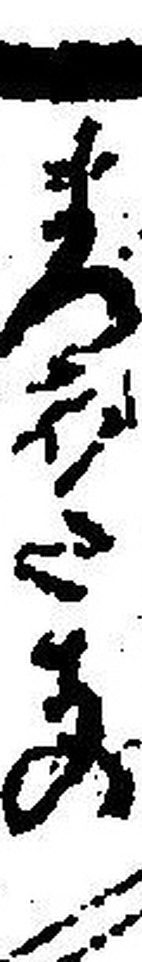まづあたまの
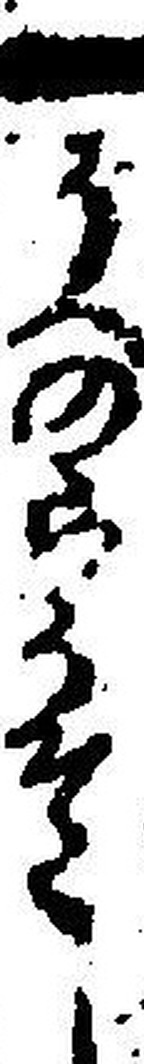うへのらうそく
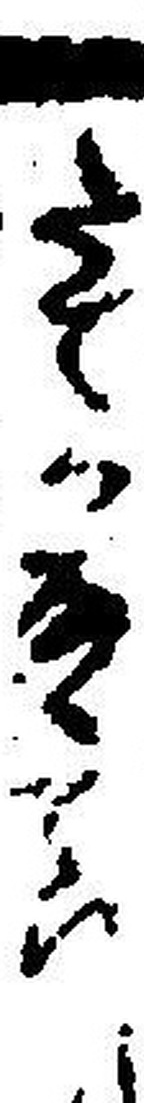たてかなくては
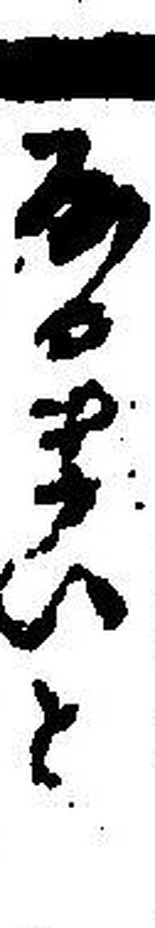なるまいと
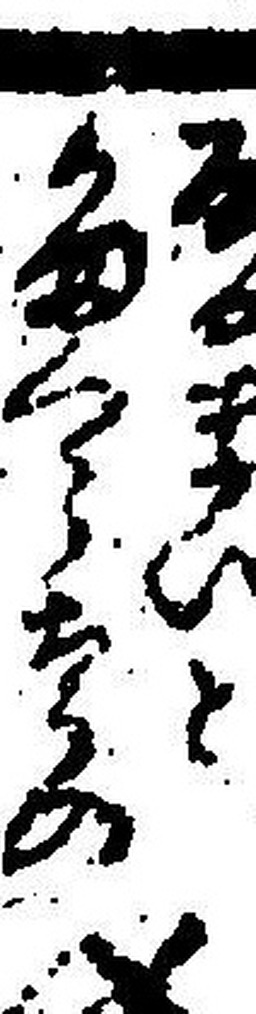かまくらちうの
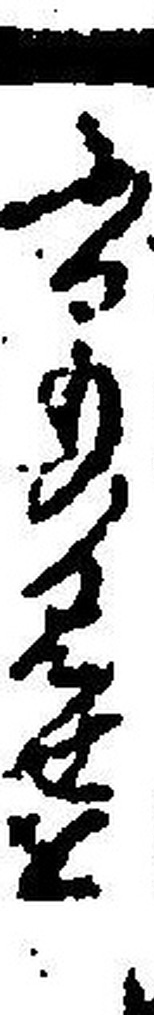ふるものみせを
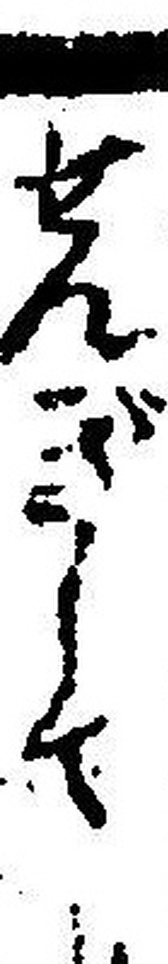せんぎして
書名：御代参牛時詣 / 市場通笑作
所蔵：東京大学総合図書館 General Library in the University of Tokyo, JAPAN
